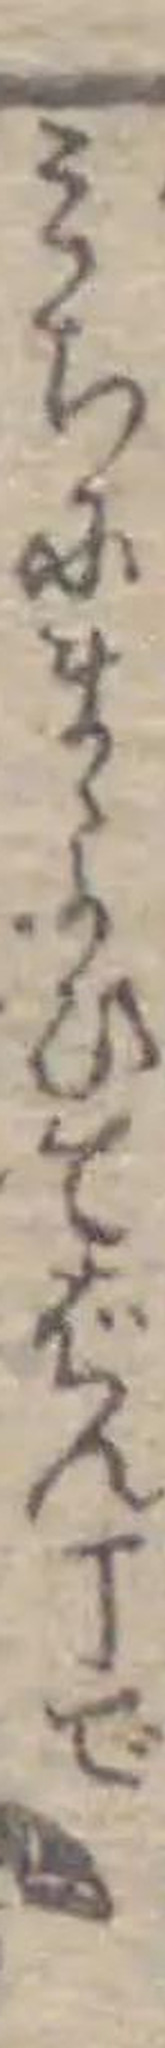みちにまよひてばん丁で
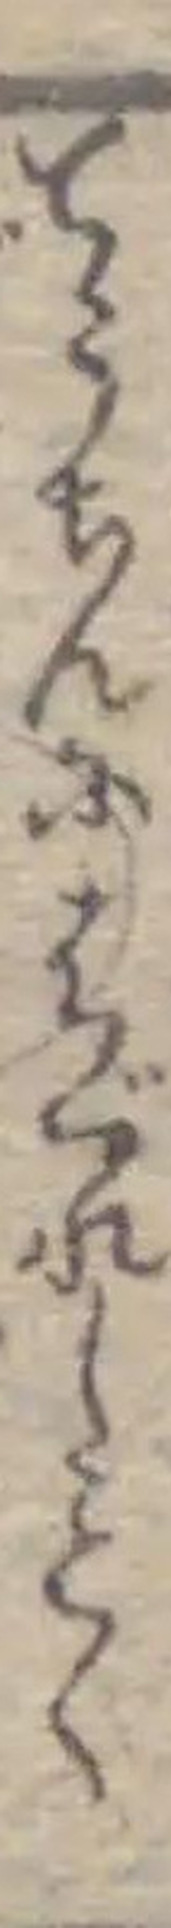てうちんにはぐれしことく
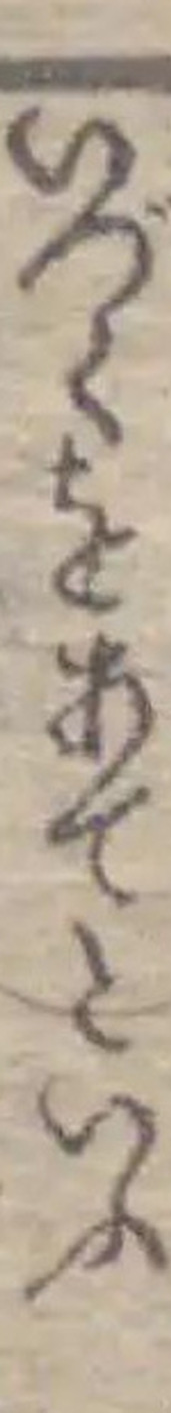いづくをあてといふ
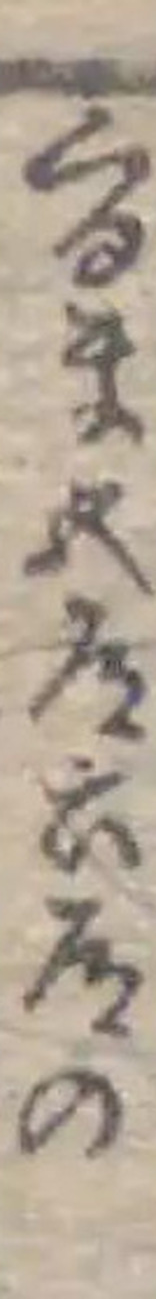くるま五道六道の
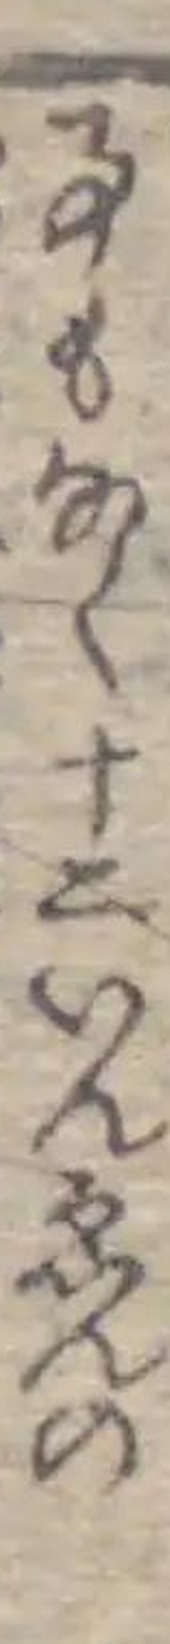事もなく十二いんゑんの
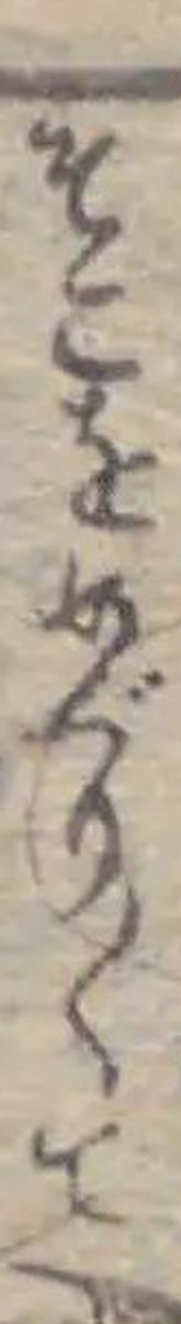そこをめぐり〳〵て
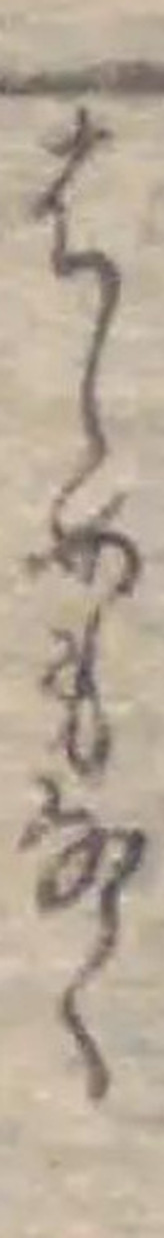はしめもなく
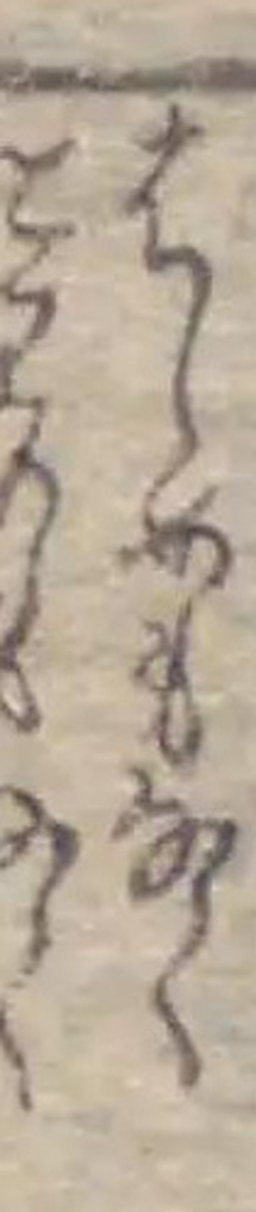おわりもなく
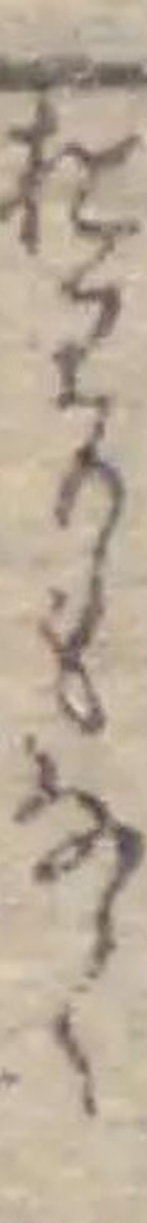おわりもなく
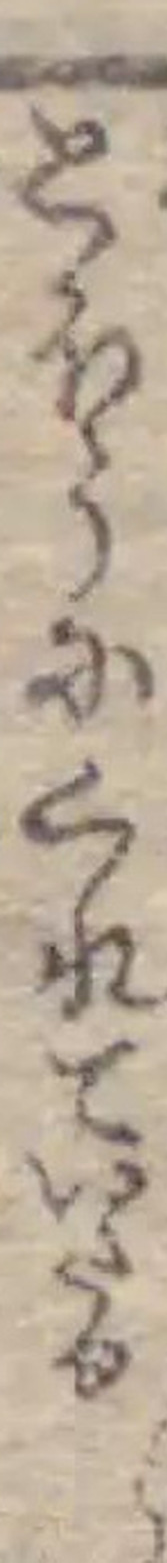とほうにくれていたる
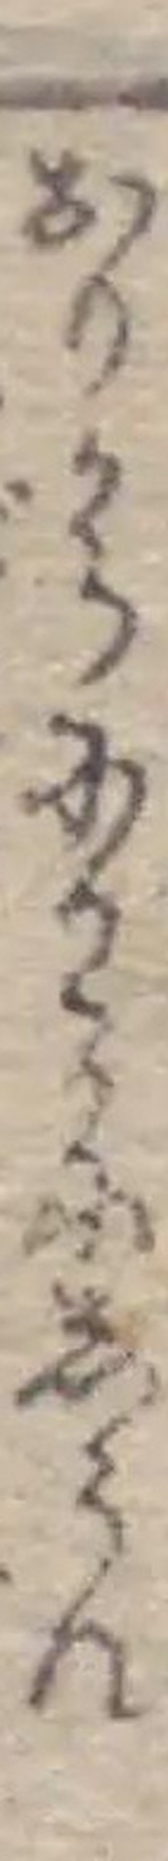おりからにわかにしうん
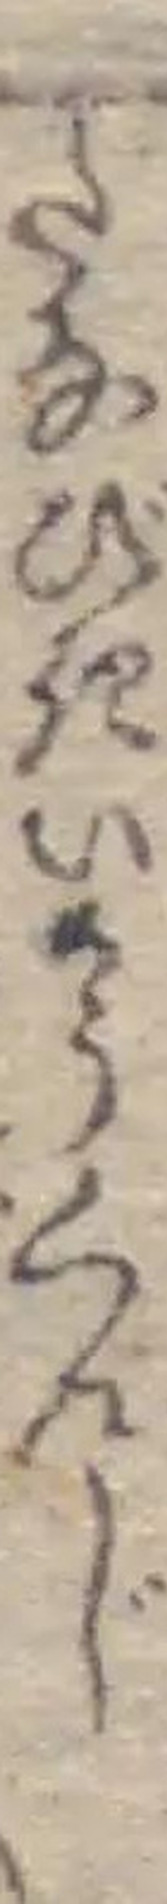たなびきいかうくんじ
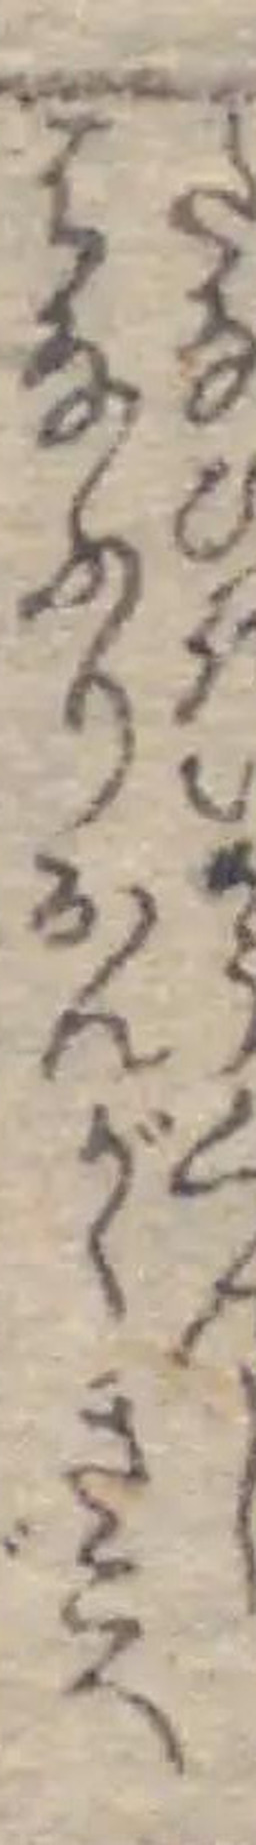はなふりおんがくきこへ
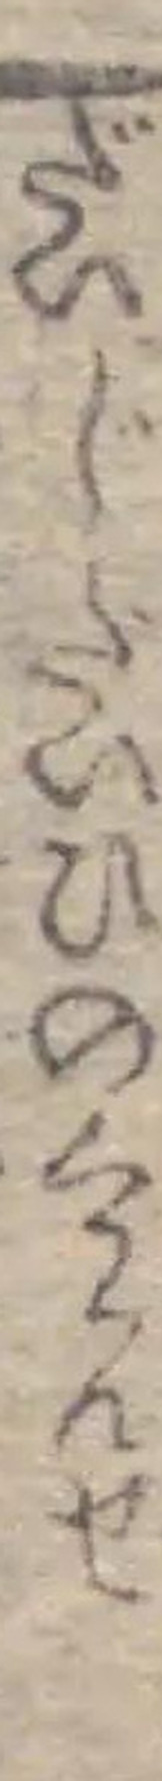だいじだいひのくわんぜ
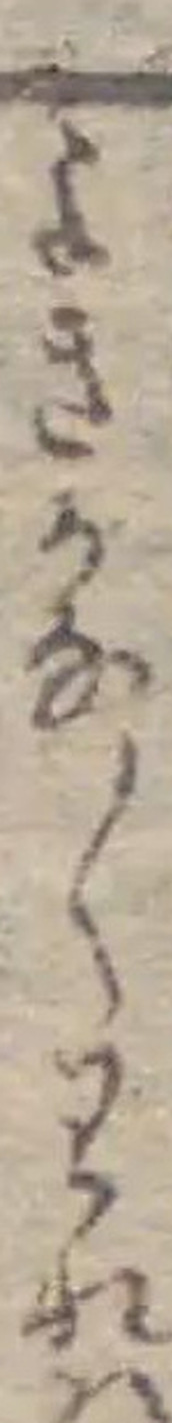よきかな〳〵われは
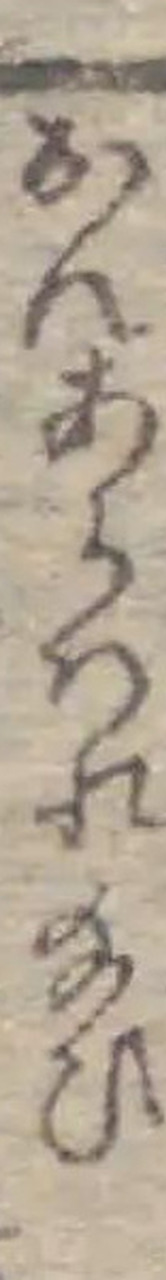おんあらはれ給ひ
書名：福壽海旡量品玉 3巻
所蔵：国立国会図書館 National Diet Library, JAPAN
